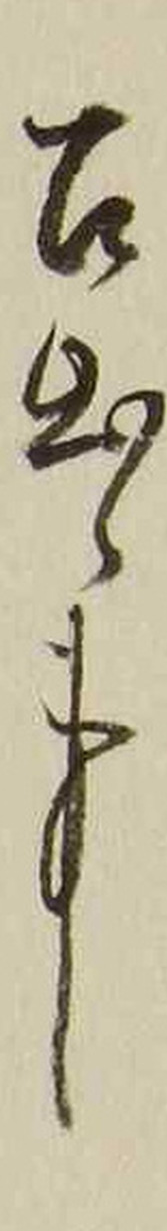召出候事
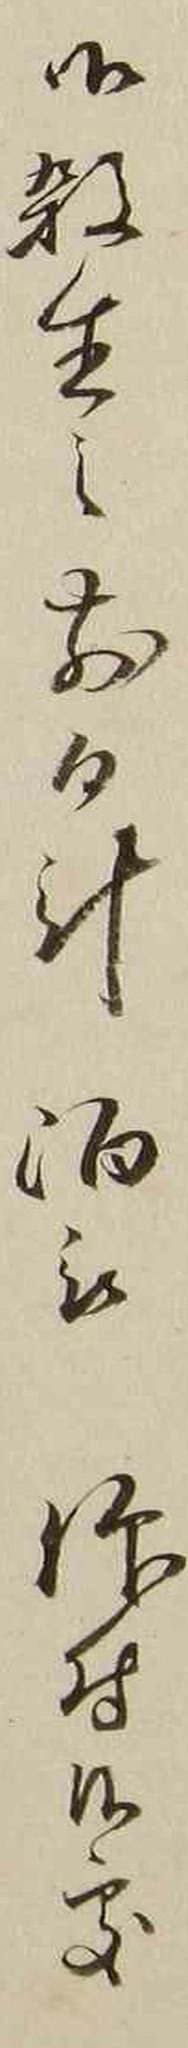御殺生之前日計泊被仰付候処
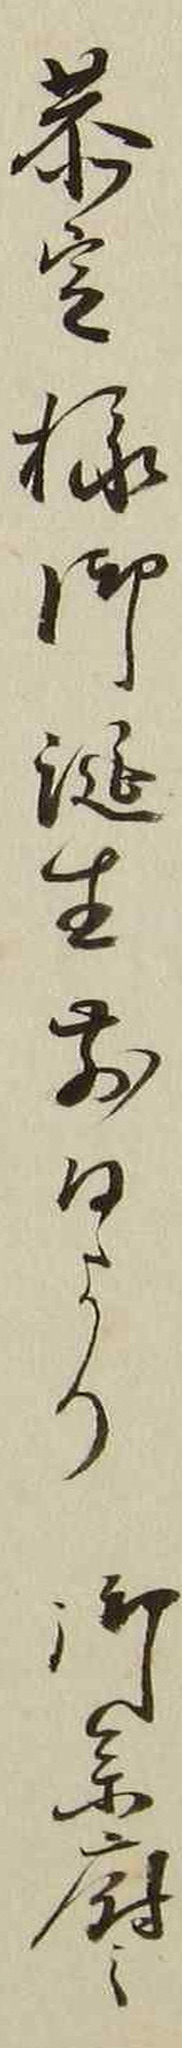恭定様御誕生前日より御参府之
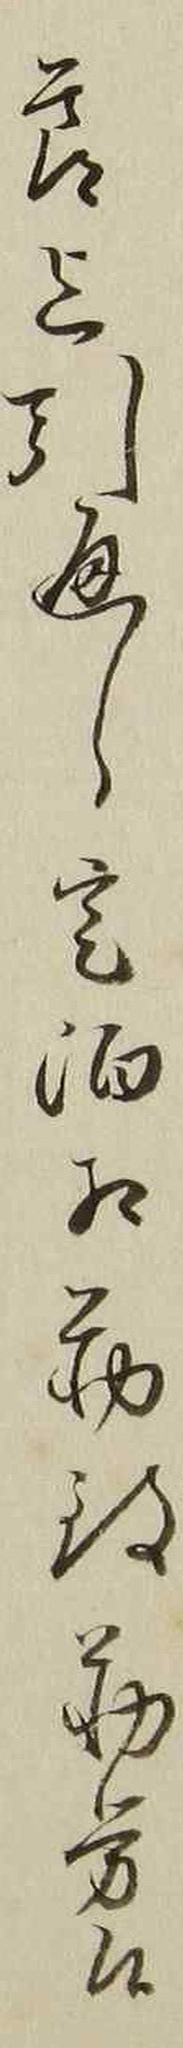節迄引通之定泊相勤致勤労候
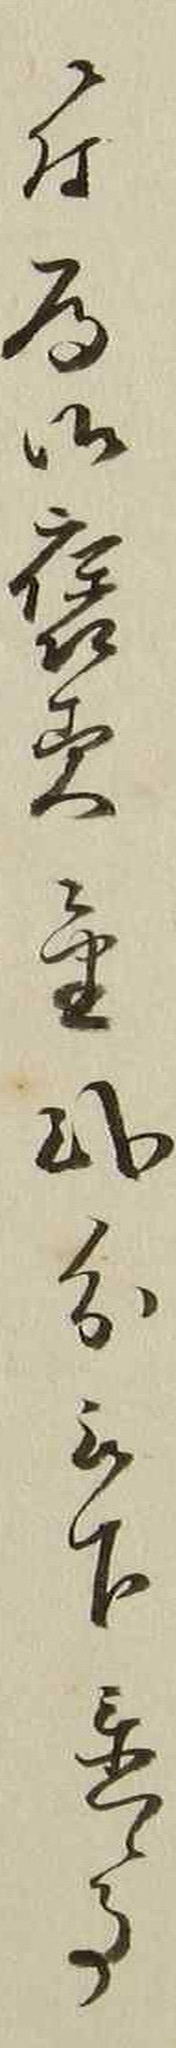ニ付為御褒美金弐分被下置候事
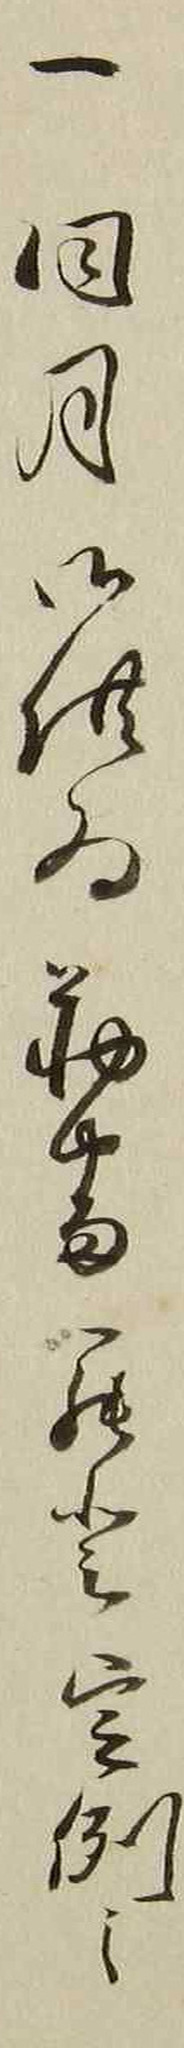一同月御供為勤番罷登定例之
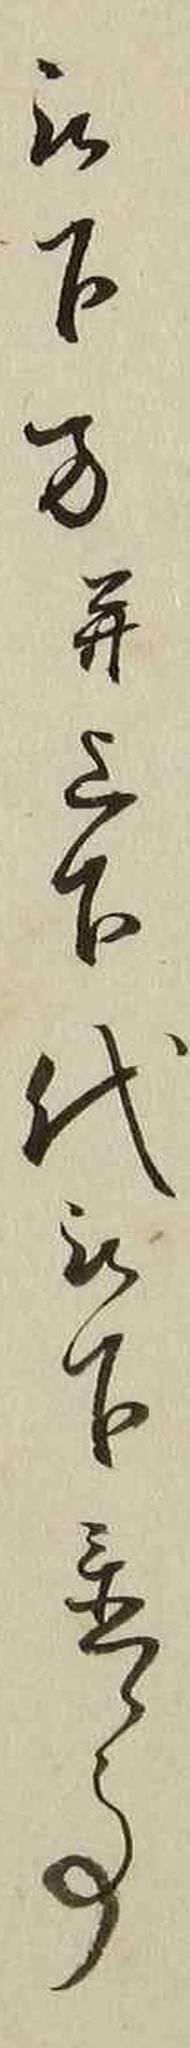被下方幷上下代被下置候事
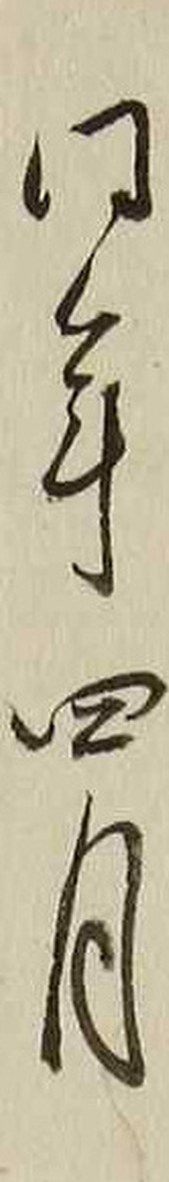同年四月
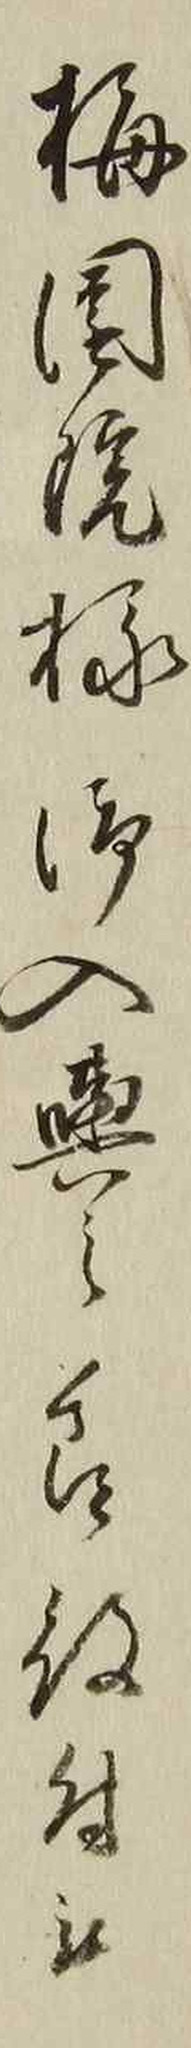梅園院様御入輿之節役付被
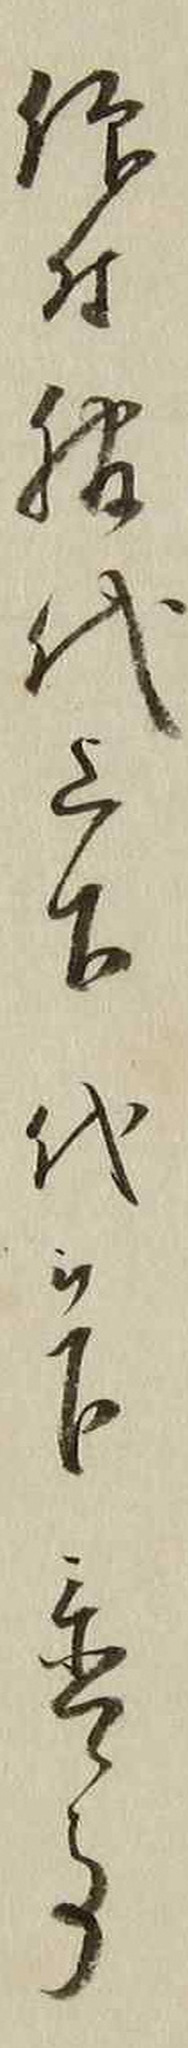仰付服代上下代被下置候事
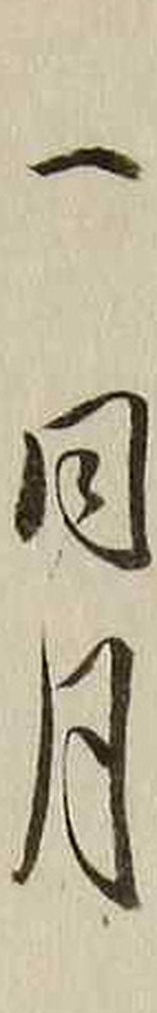一同月
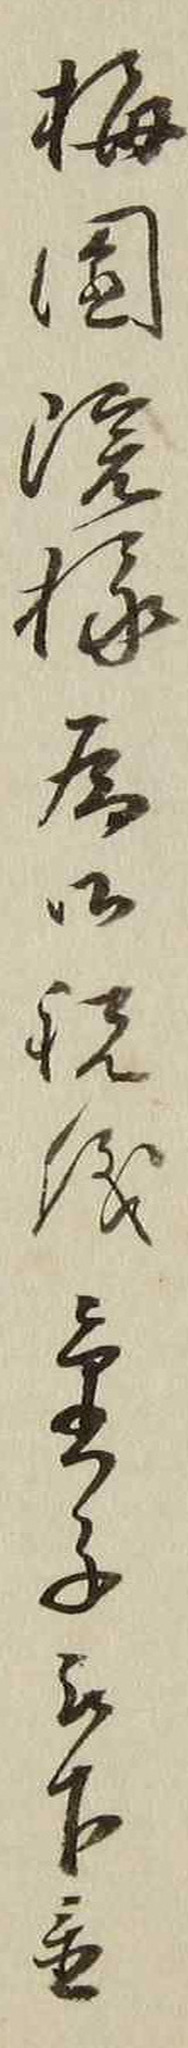梅園院様為御祝儀金子被下置
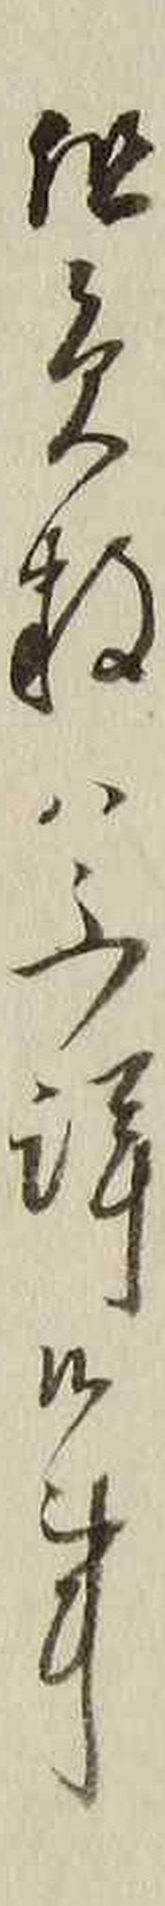但員数ハ不詳候事
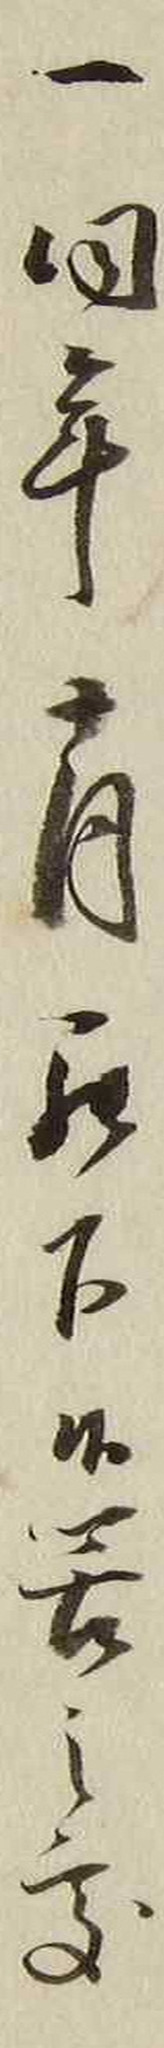一同年十月罷下候筈之処
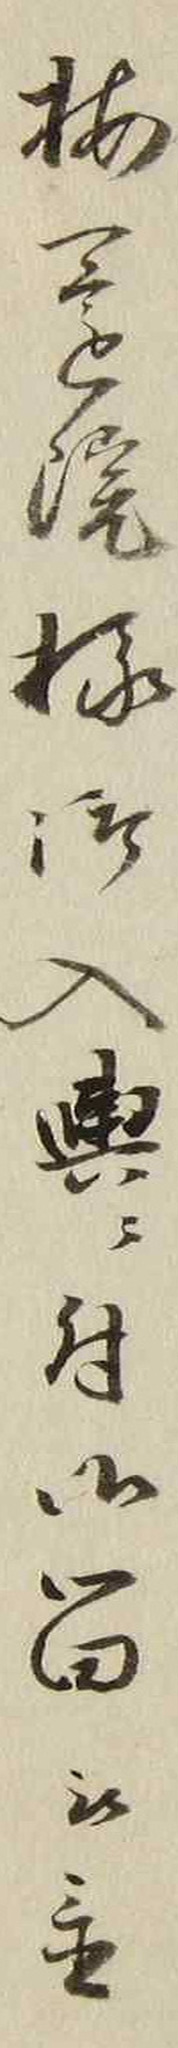梅園院様御入輿ニ付御留被置
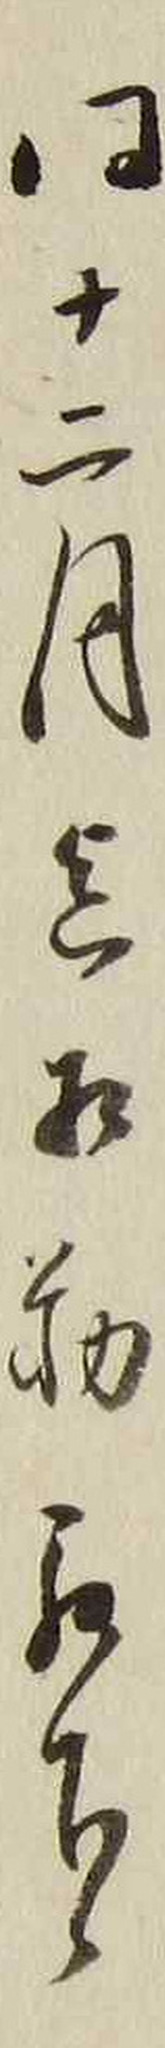同十二月迄相勤罷下候
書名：諸士系譜　巻之52　に之部3
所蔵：会津若松市立会津図書館
